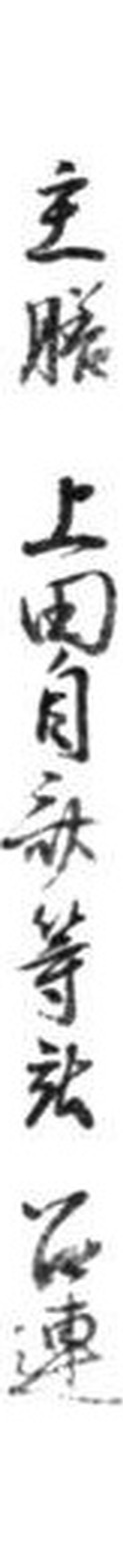主膳上田自齋等被召連
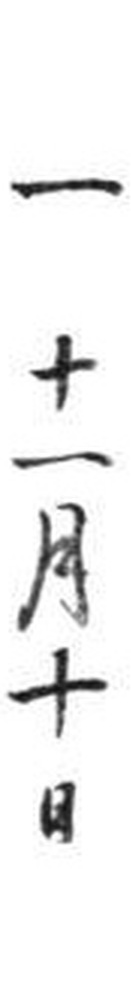一十一月十日
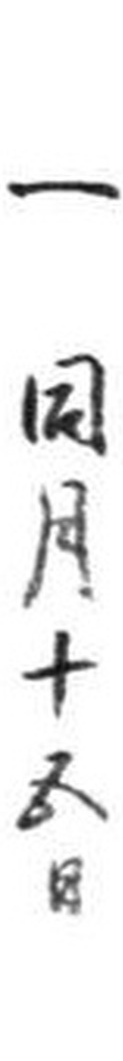一同月十五日
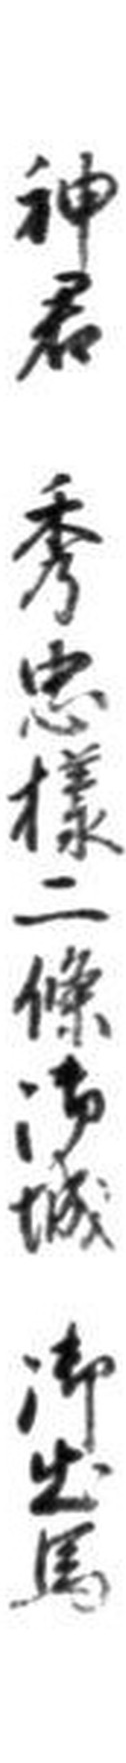神君秀忠様二条御城御出馬
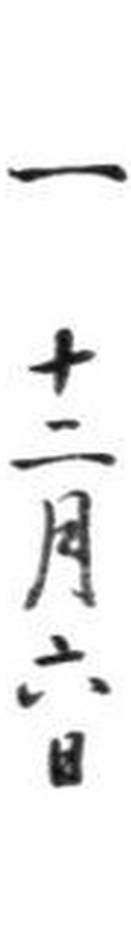一十二月六日
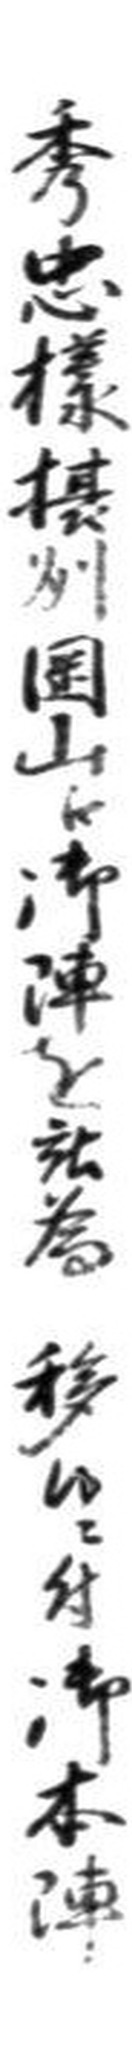秀忠様摂州岡山江御陣を被為移候ニ付御本陣
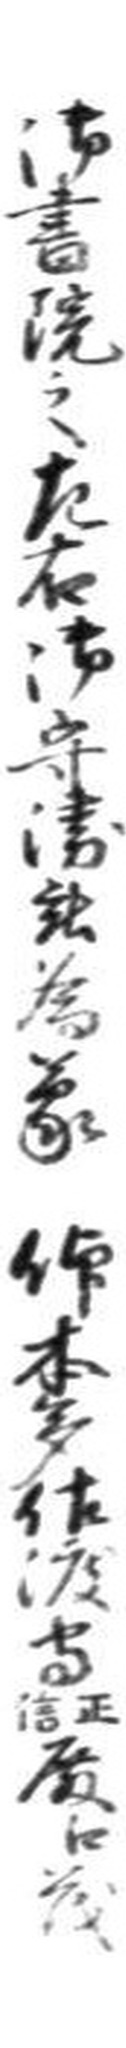御書院之左右御守衛被為蒙仰本多佐渡守正信殿江も
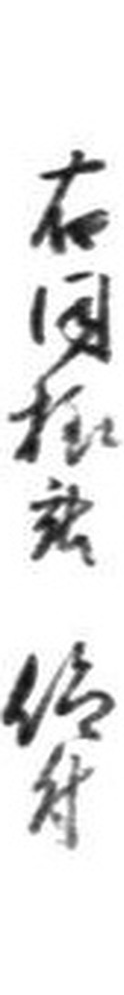右同様被仰付
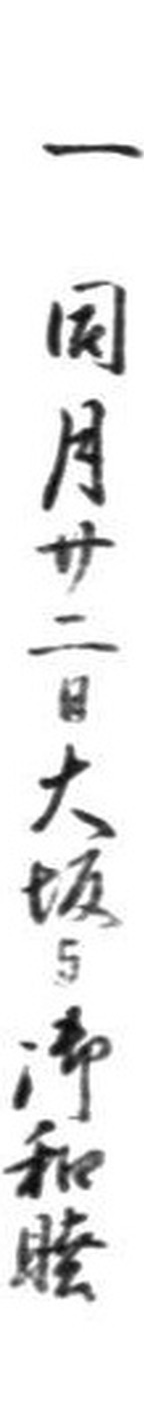一同月廿二日大坂と御和睦
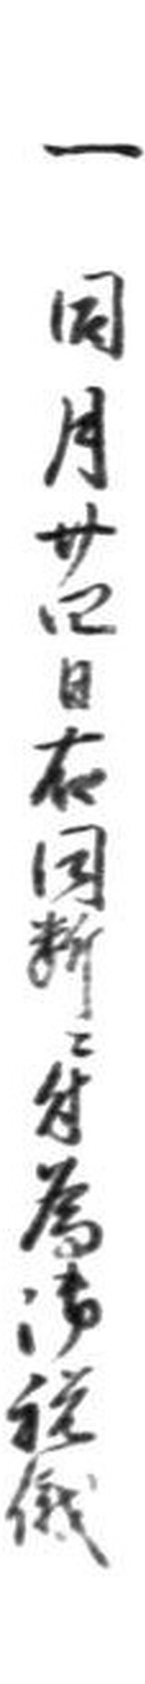一同月廿四日右同断ニ付為御祝儀
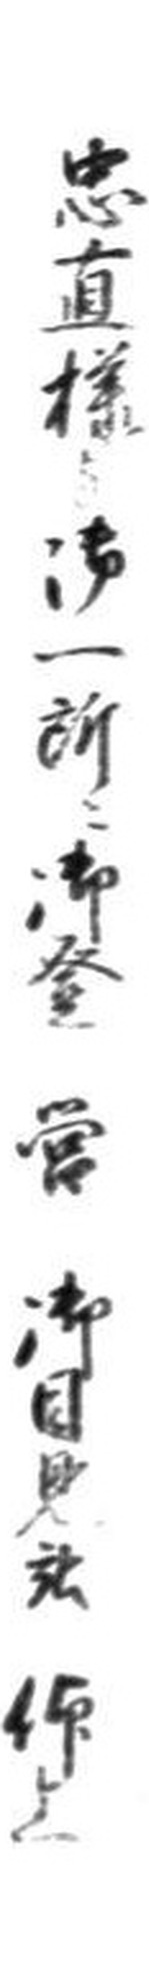忠直様と御一所ニ御登営御目見被仰上
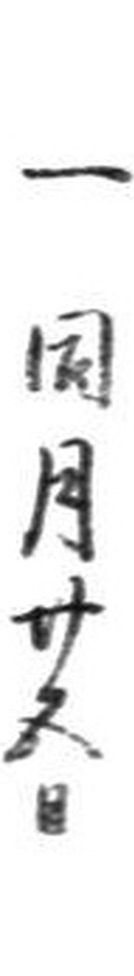一同月廿五日
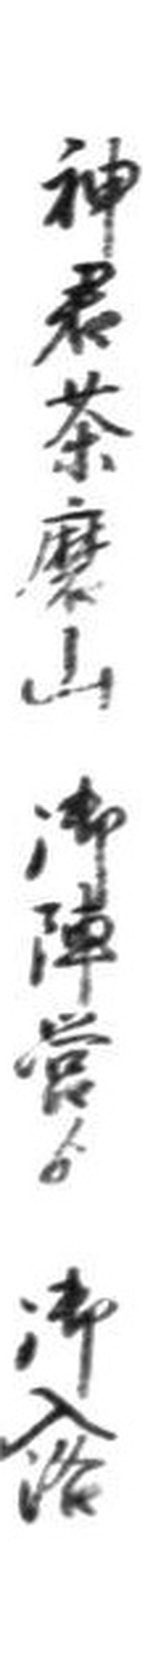神君茶磨山御陣営ゟ御入洛

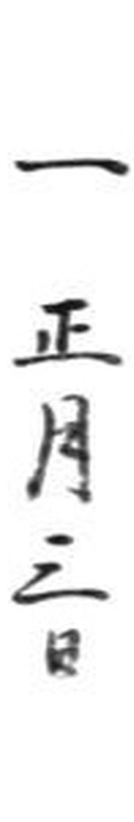一正月三日
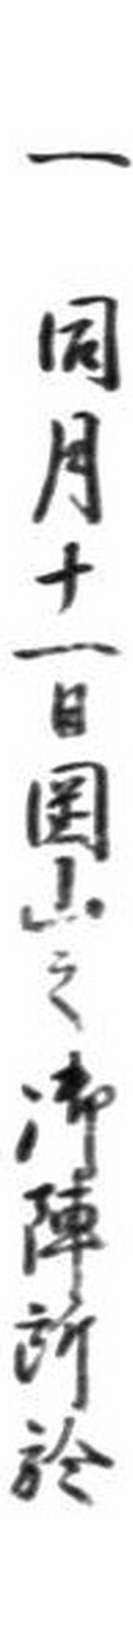一同月十一日岡山之御陣所於
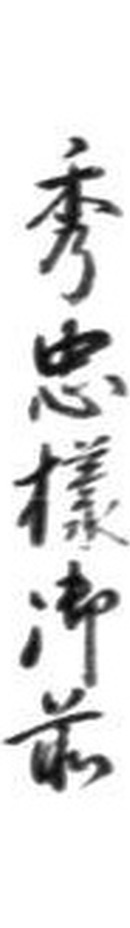秀忠様御前
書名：家譜 三 忠昌公 従慶長八年到寛永六年
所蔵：福井県文書館 Fukui Prefectural Archives
